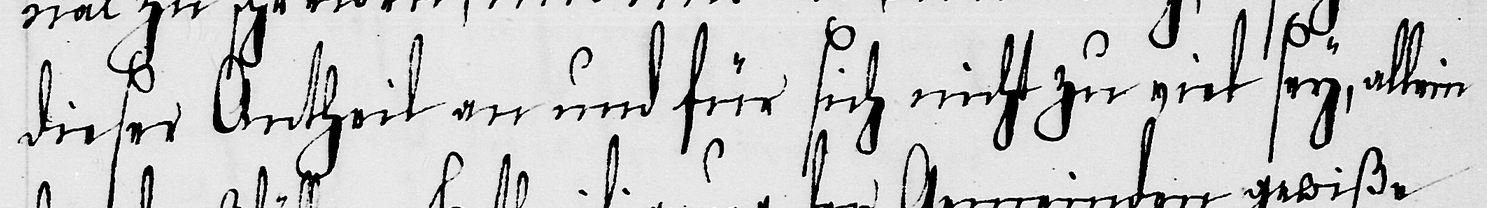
dieser Antheil an und für sich nicht zu viel sey, allein
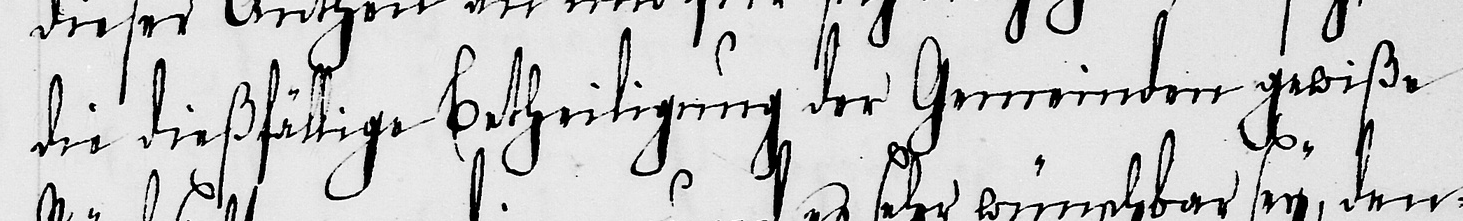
die dießfällige Betheiligung der Gemeinden gewiße
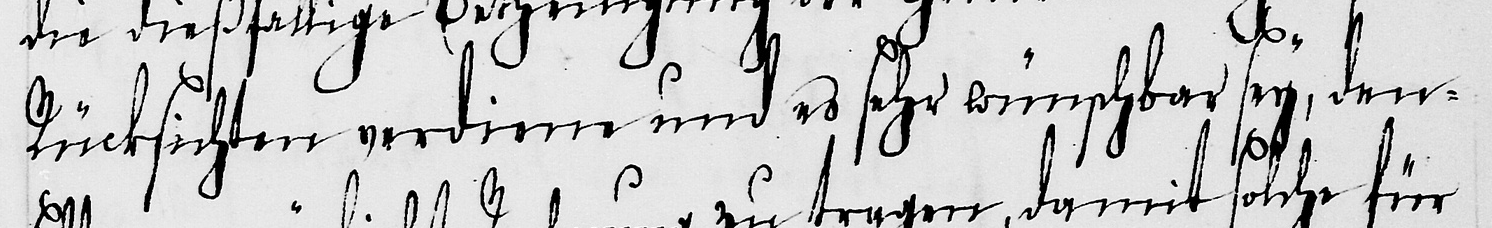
Rücksichten verdiene und es sehr wünschbar sey, den¬
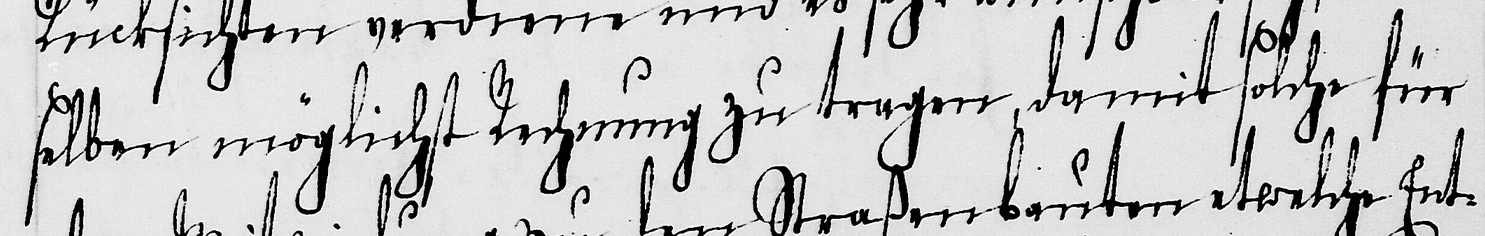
selben möglichst Rechnung zu tragen, damit solche für
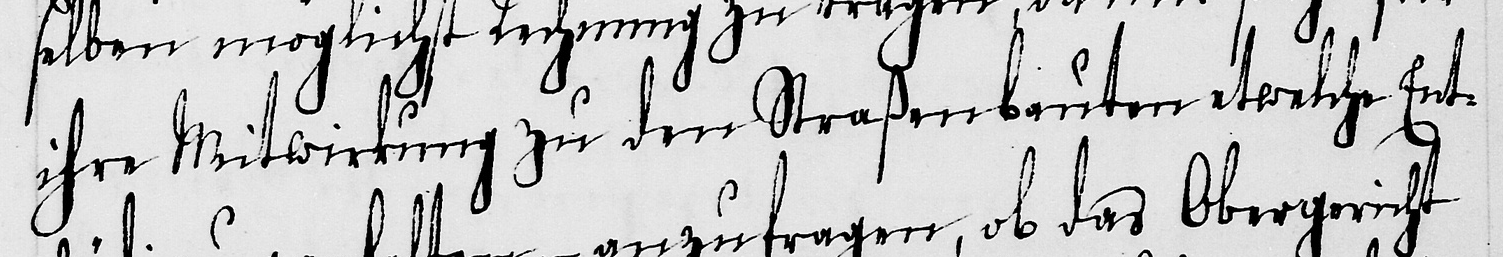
ihre Mitwirkung zu den Straßenbauten etwelche Ent¬
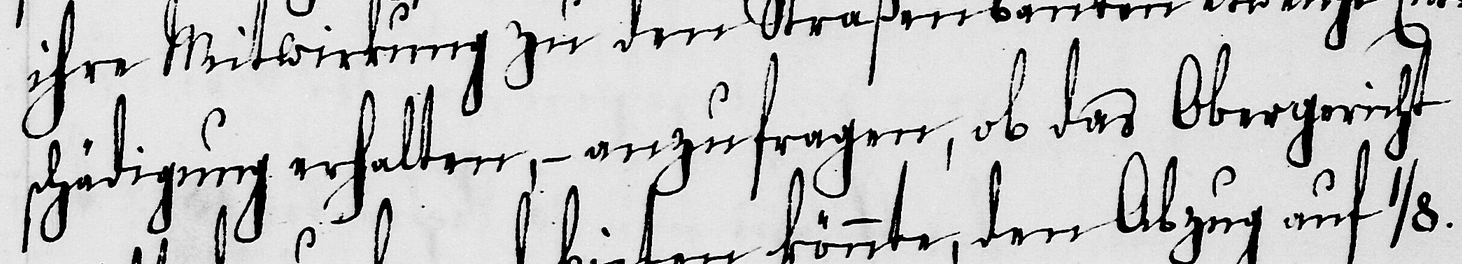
schädigung erhalten, – anzufragen, ob das Obergericht
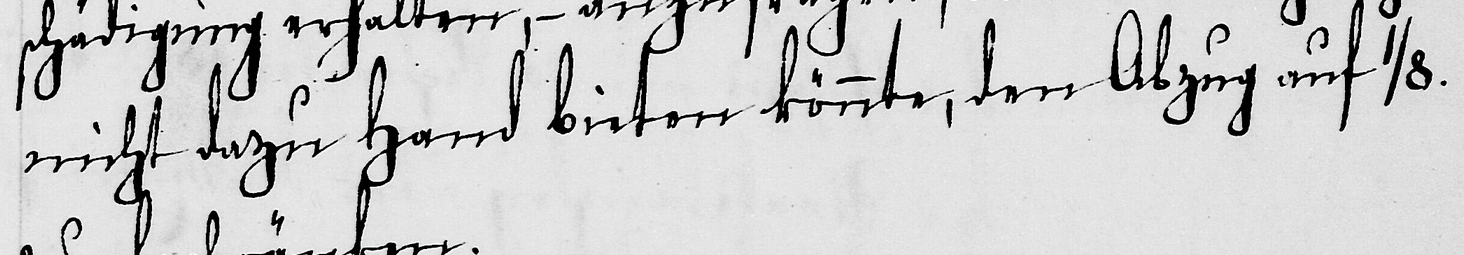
nicht dazu Hand bieten könnte, den Abzug auf ⅛.
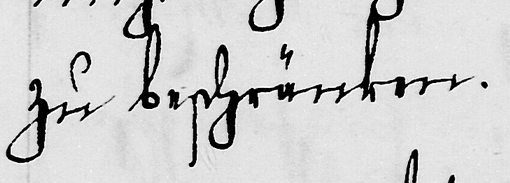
zu beschränken.
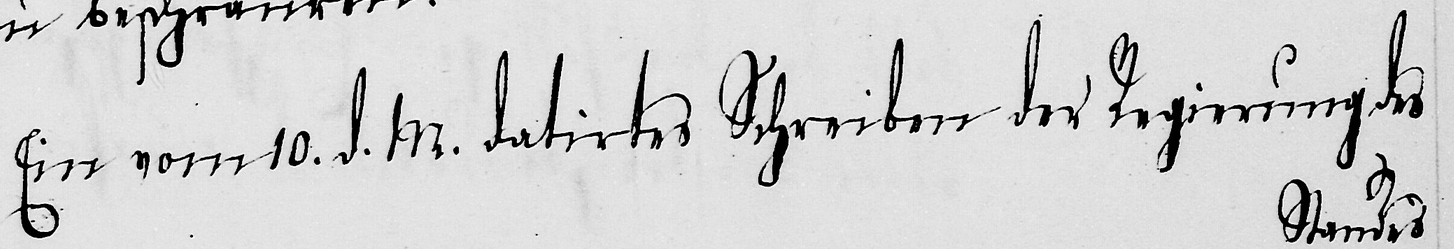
Ein vom 10. d. M. datirtes Schreiben der Regierung des
